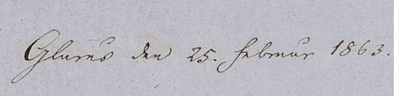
Glarus den 25. Februar 1863.
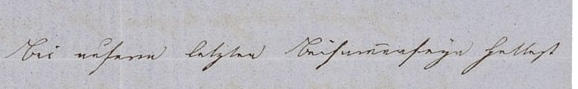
Bei unserm letzten Beisammenseyn hattest
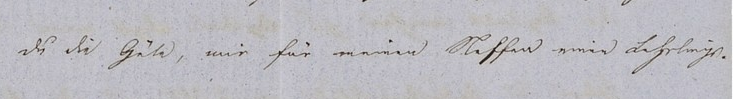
Du die Güte, mir für meinen Neffen einen Lehrlings-
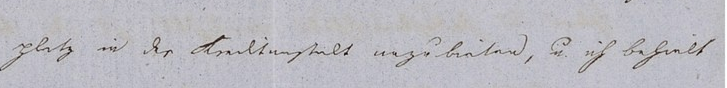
platz in der Kreditanstalt anzubieten, u. ich behielt
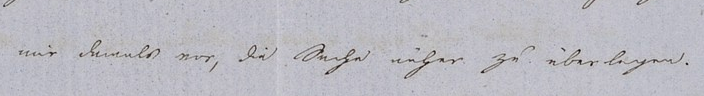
mir damals vor, die Sache näher zu überlegen.
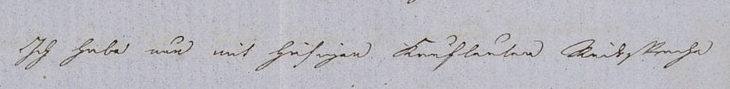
Ich habe nun mit hiesigen Kaufleuten Rücksprache
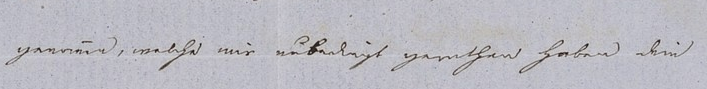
genommen, welche mir unbedingt gerathen haben Dein
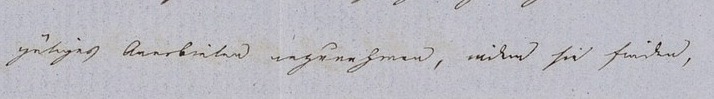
gütiges Anerbieten anzunehmen, indem sie finden,
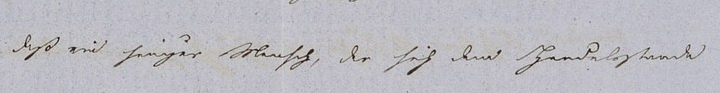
daß ein junger Mensch, der sich dem Handelsstande
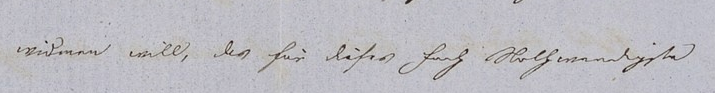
widmen will, das für dieses Fach Nothwendigste
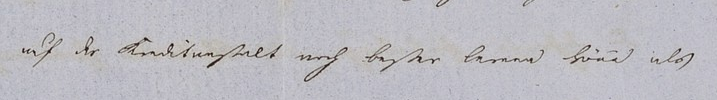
auf der Kreditanstalt noch beßer lernen könne als
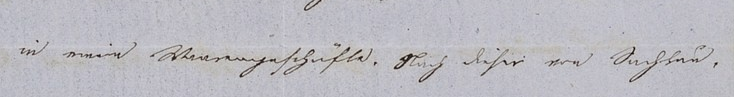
in einem Waarengeschäfte. Nach dieser von Sachkun-
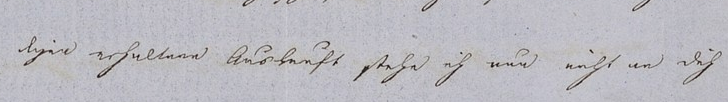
digen erhaltnen Auskunft stehe ich nun nicht an Dich
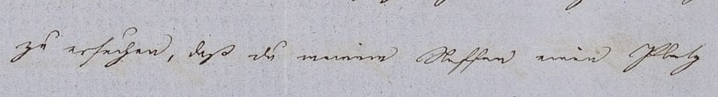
zu ersuchen, daß Du meinem Neffen einen Platz
